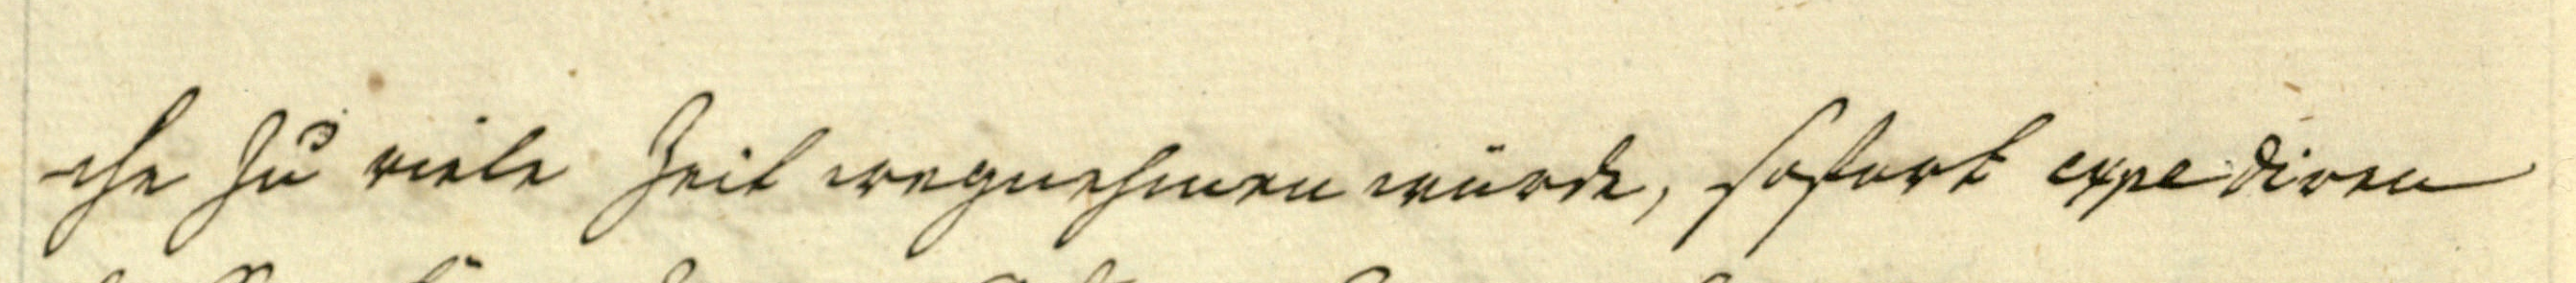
ihn zu viele Zeit wegnehmen würde, sofort expediren
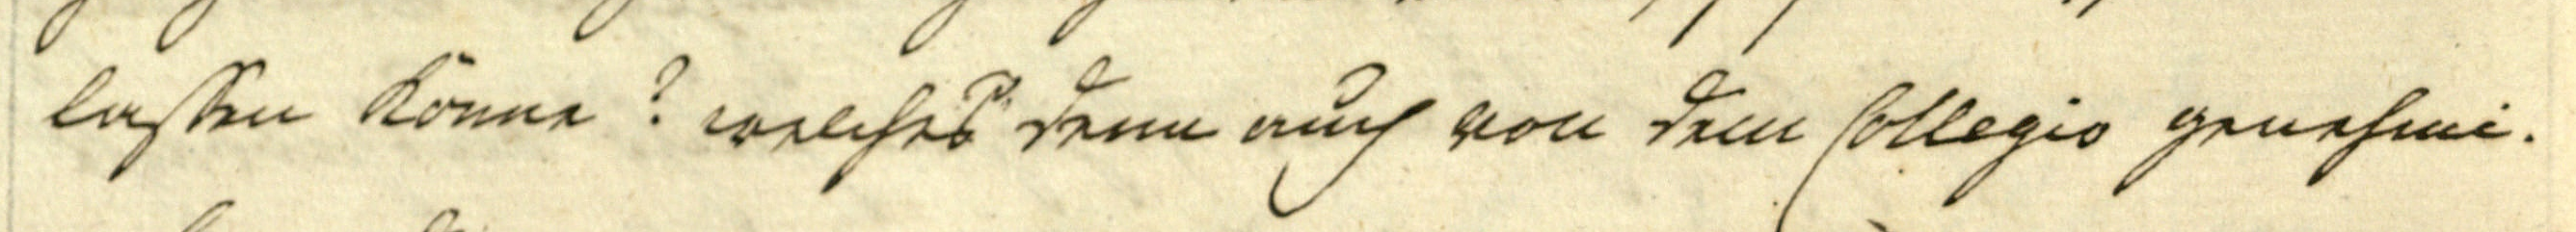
lassen könne? welches denn auch von dem Collegio genehmi¬
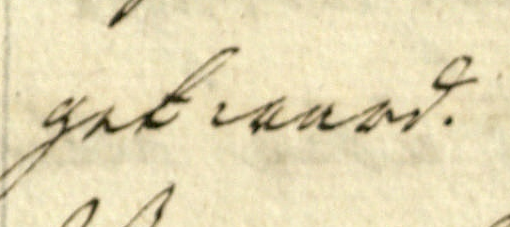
get ward.
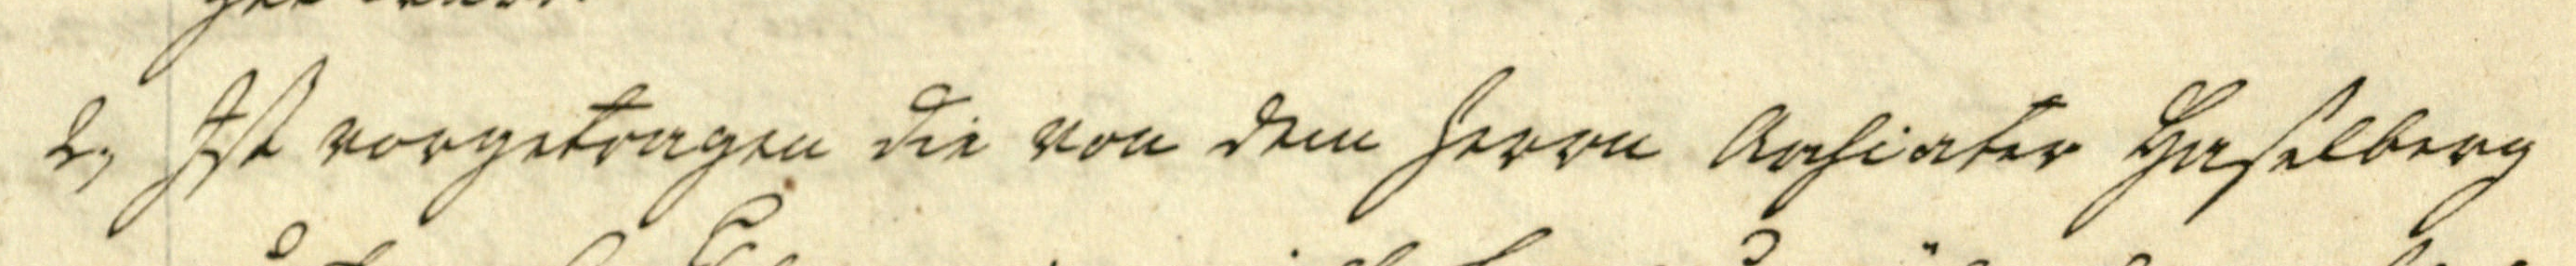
2., Ist vorgetragen die von dem Herrn Archiater Haselberg
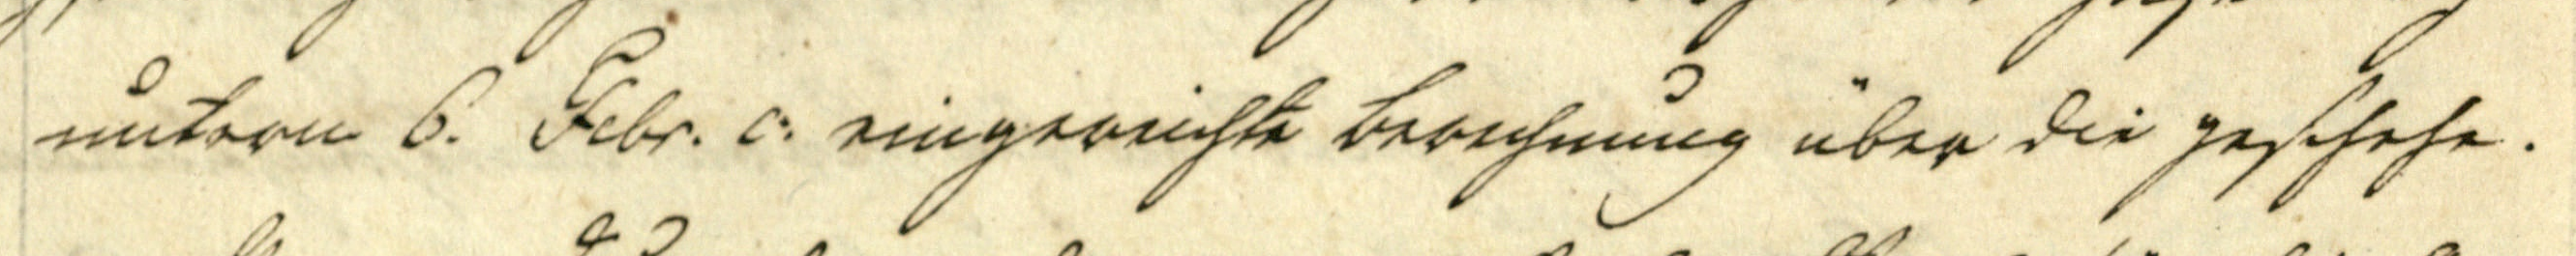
unterm 6. Febr. c. eingereichte Berechnung über die geschehe¬
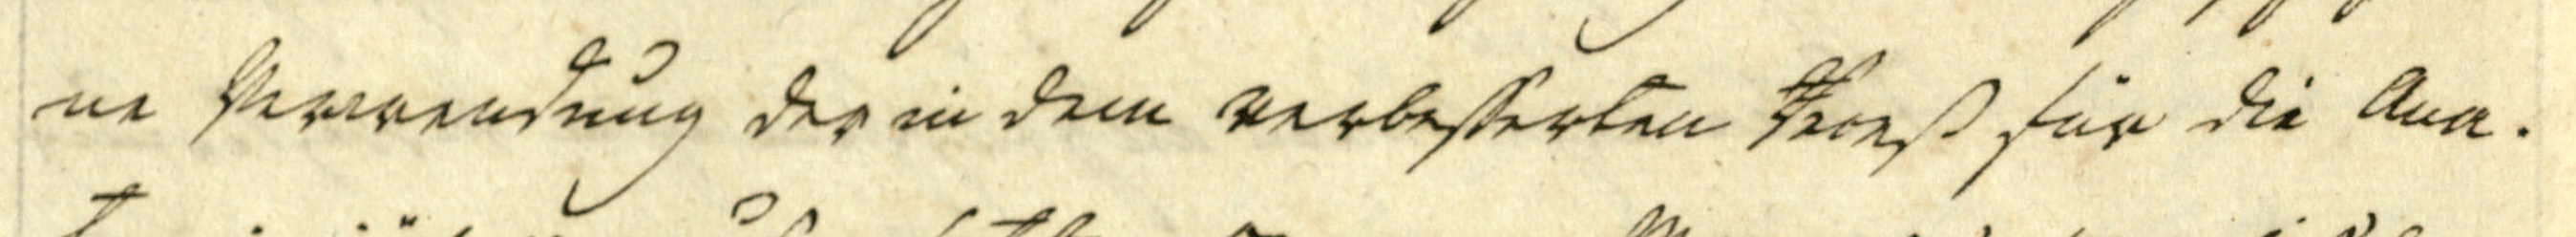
ne Verwendung der in dem verbesserten Receß für die Ana¬
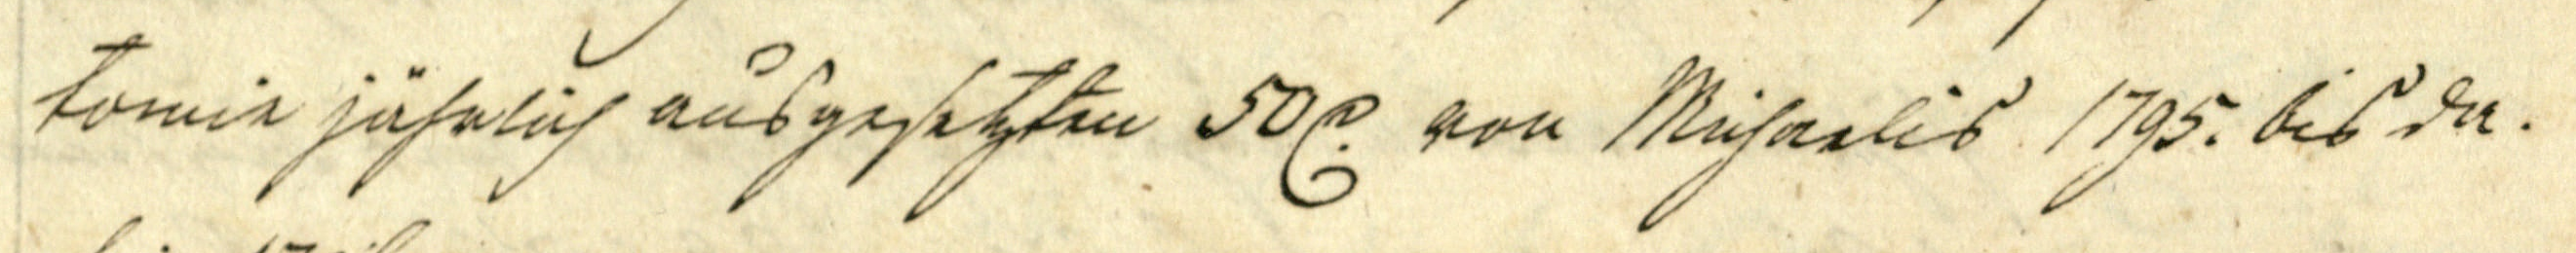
tomie jährlich ausgesetzten 50 l. von Michaelis 1795. bis da¬
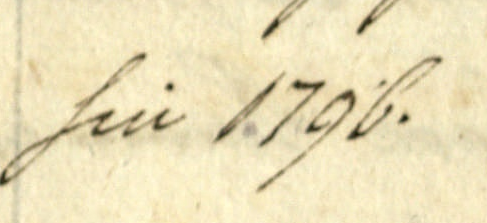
hin 1796.
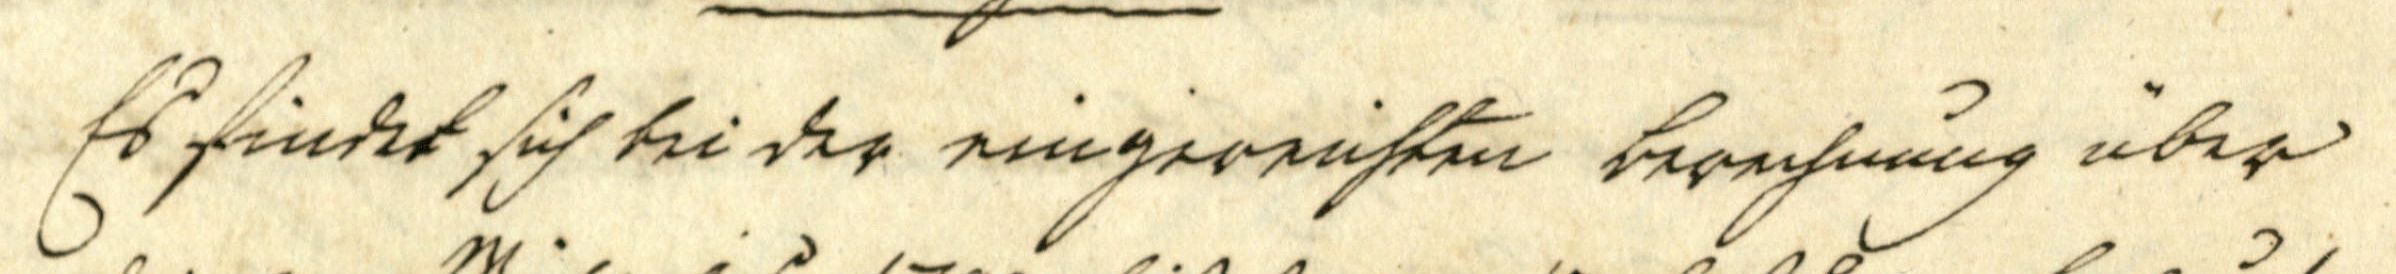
Es findet sich bei der eingereichten Berechnung über
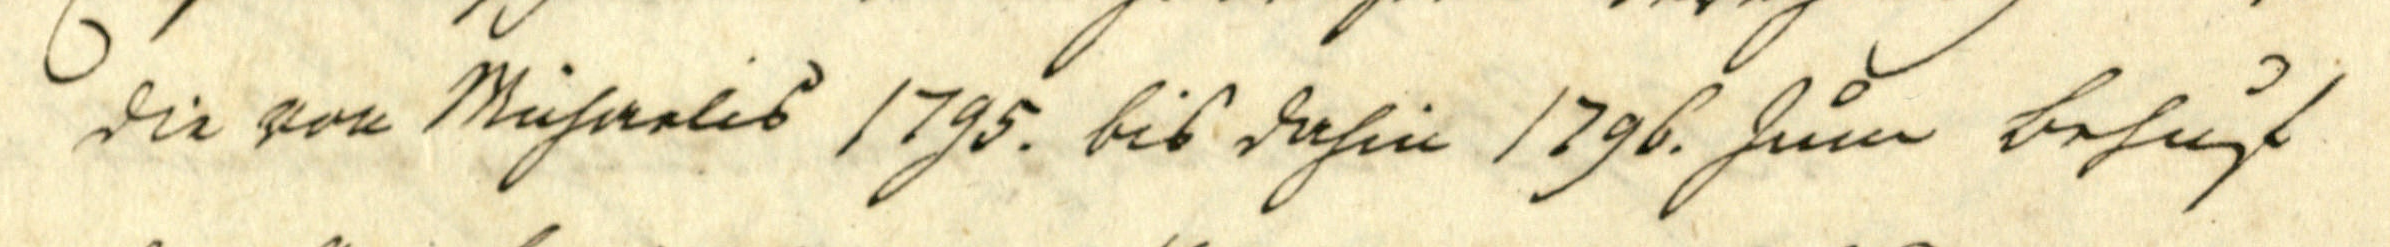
die von Michaelis 1795. bis dahin 1796. zum Behuf
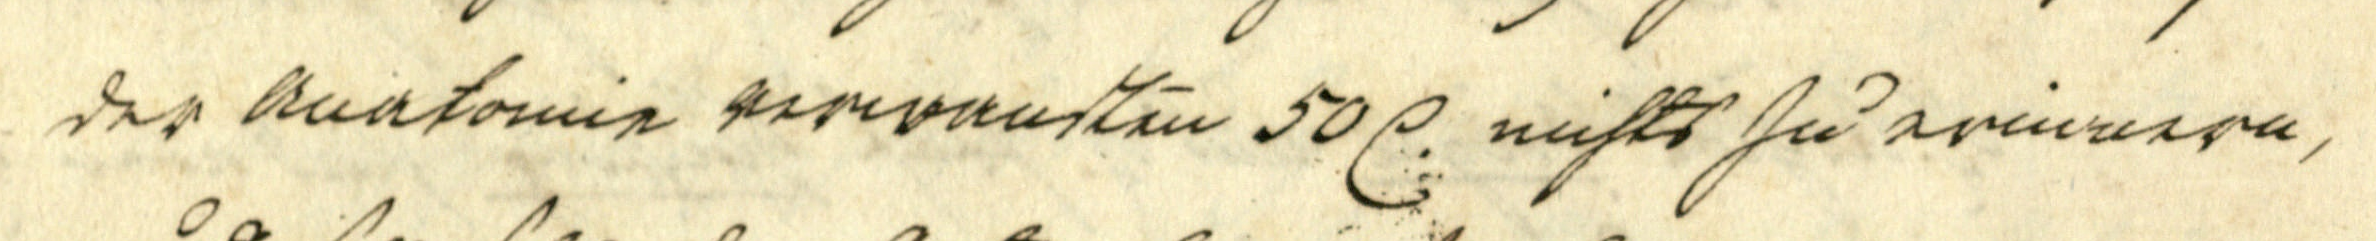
der Anatomie verwandten 50 l. nichts zu erinnern,
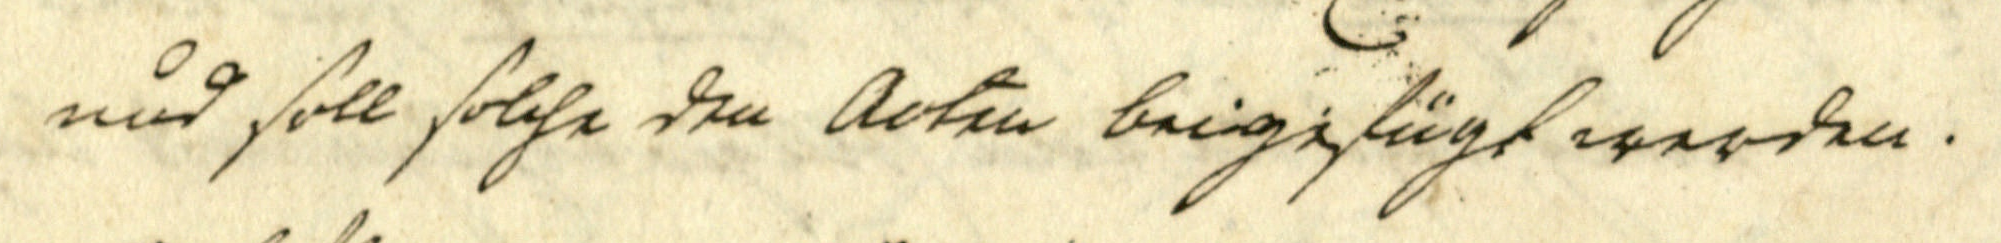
und soll solche den Acten beigefügt werden.
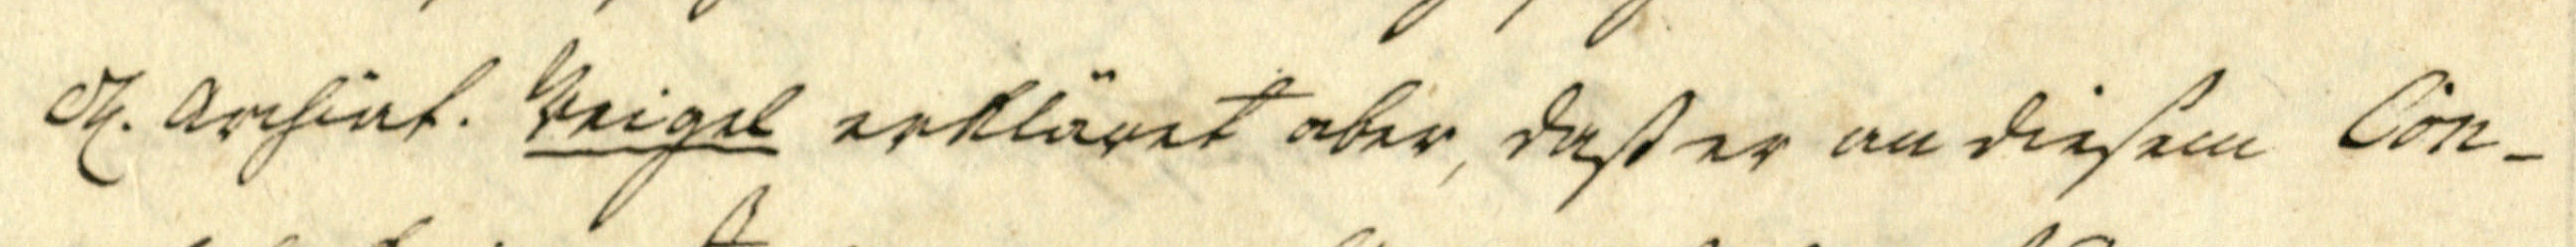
dh. Archiat. Weigel erkläret aber, daß er an diesem Con¬
